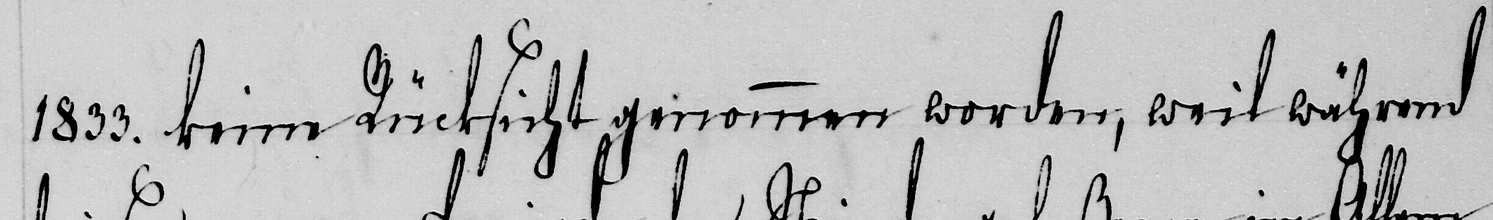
1833. keine Rücksicht genommen worden, weil während
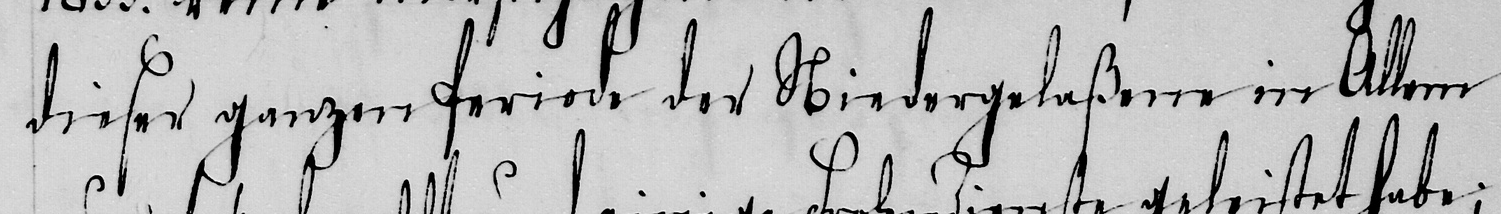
dieser ganzen Periode der Niedergelaßene in Allem
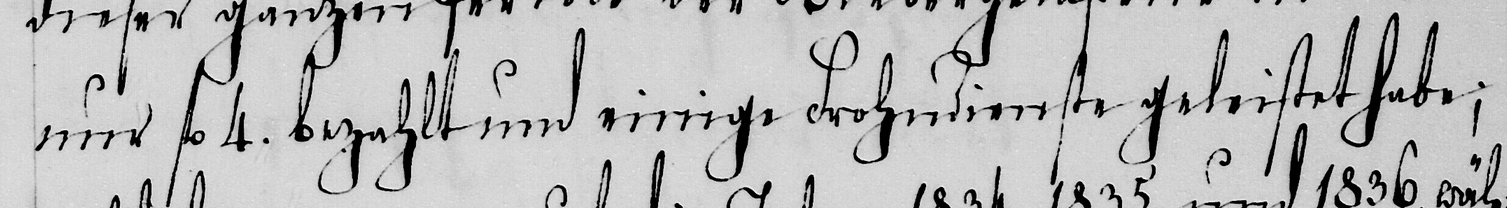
nur fl. 4. bezahlt und einige Frohndienste geleistet habe;
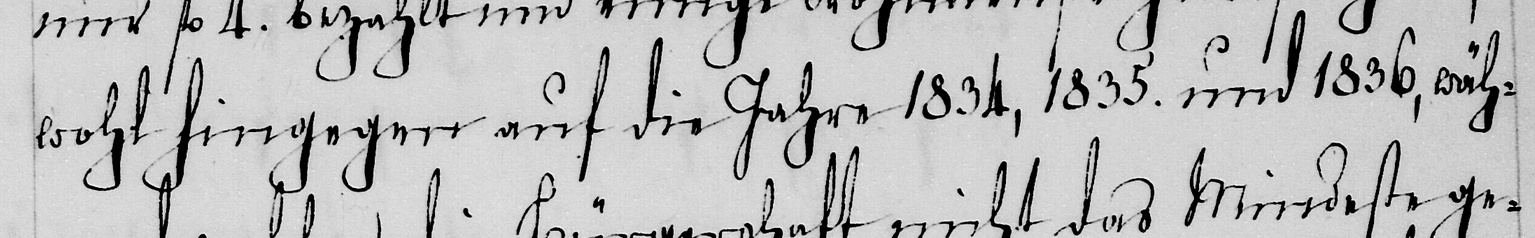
wohl hingegen auf die Jahre 1834, 1835. und 1836, wäh¬
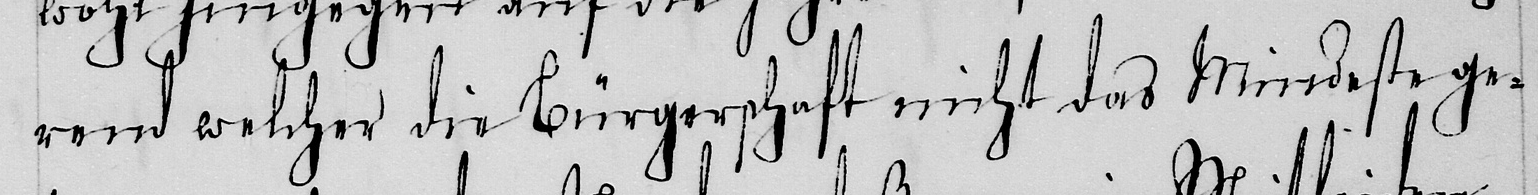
rend welcher die Bürgerschaft nicht das Mindeste ge¬
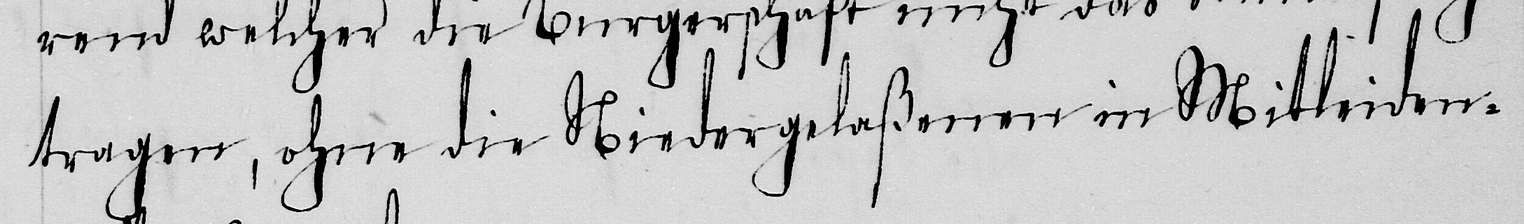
tragen, ohne die Niedergelaßenen in Mitleiden¬
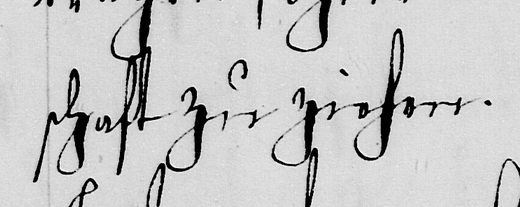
schaft zu ziehen.
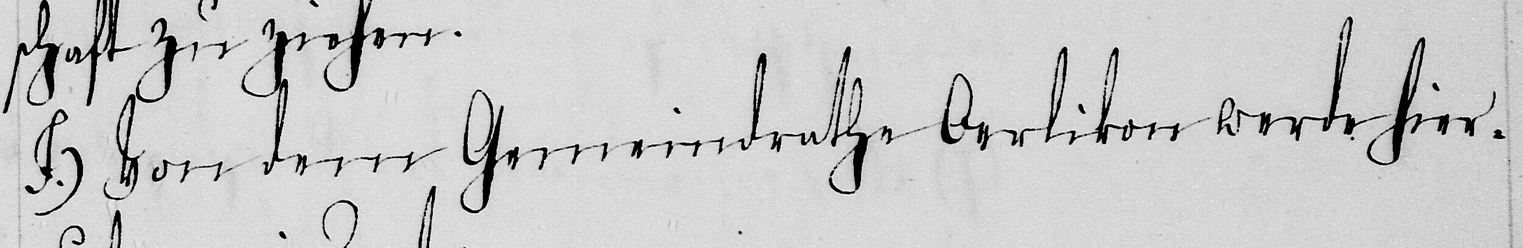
F.) Von dem Gemeindrathe Oerlikon werde hier¬
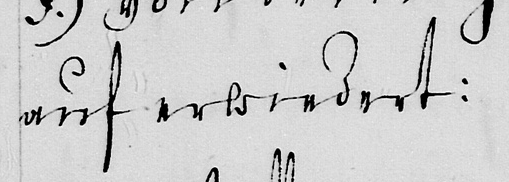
auf erwiedert:
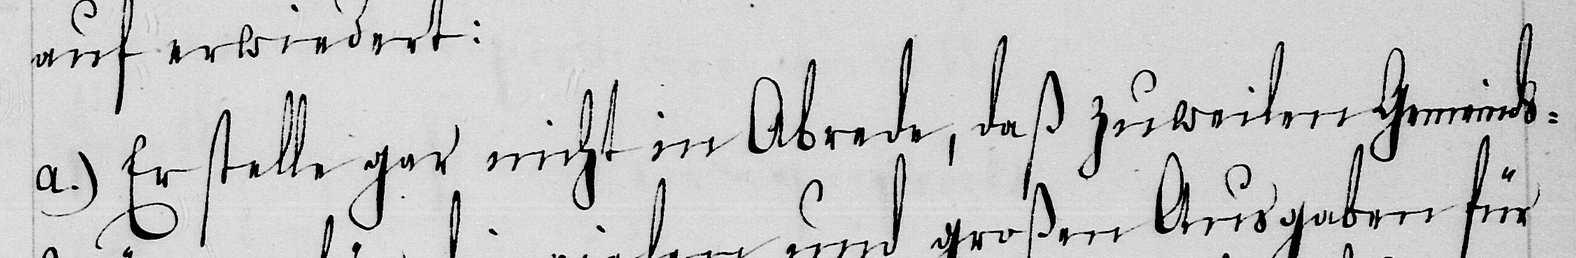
a.) Er stelle nicht in Abrede, daß zuweilen Gemeinds¬
